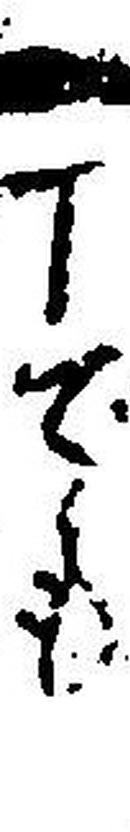丁でも
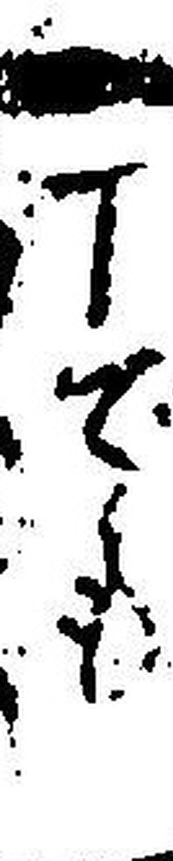丁でも
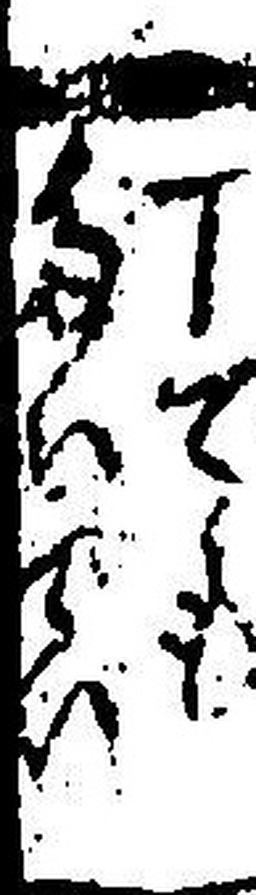たいてい
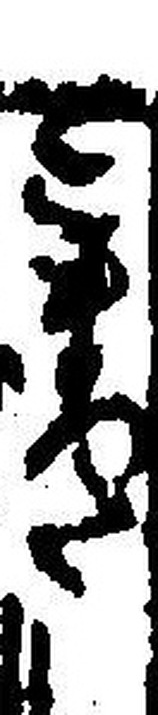こまつた
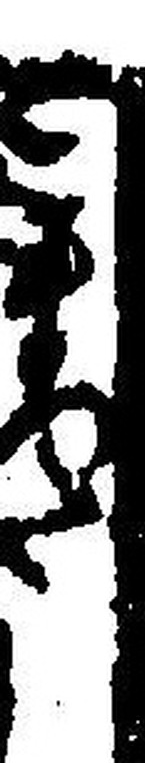こまつた
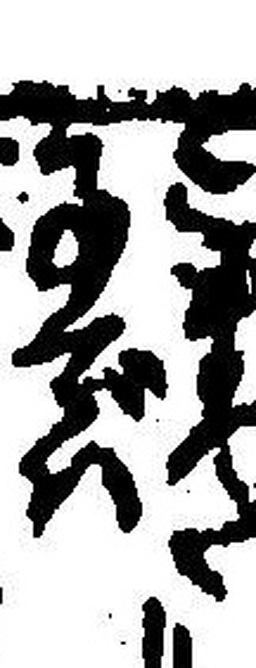事では
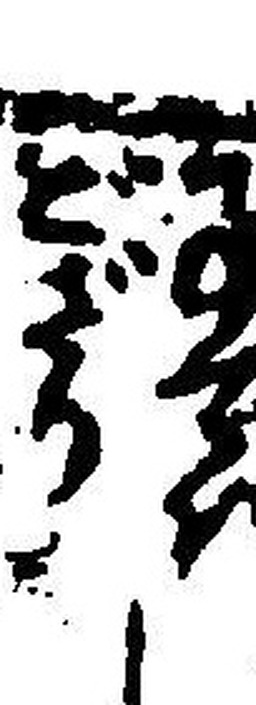ござり
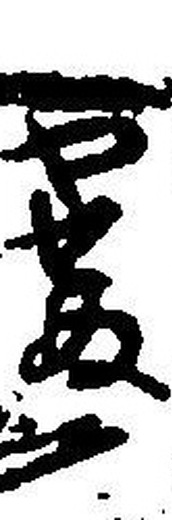やせぬ
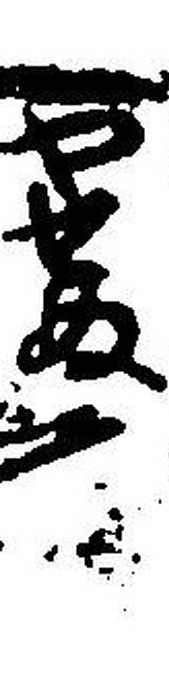やせぬ
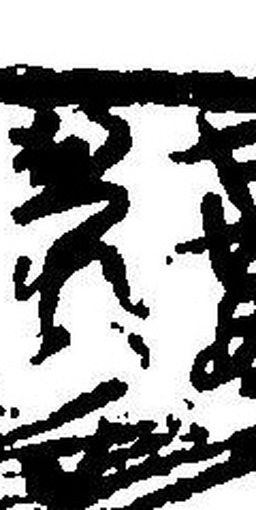おつれは
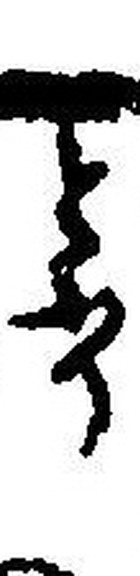とふり
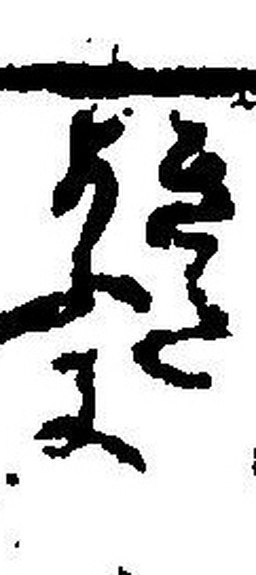よふに
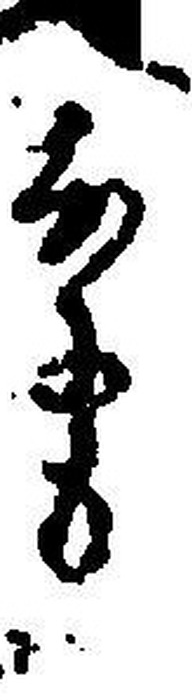なにも
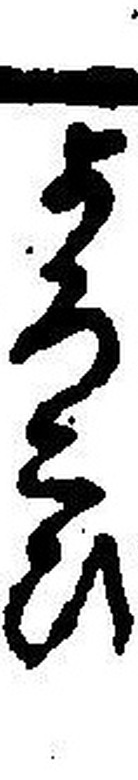よろこび
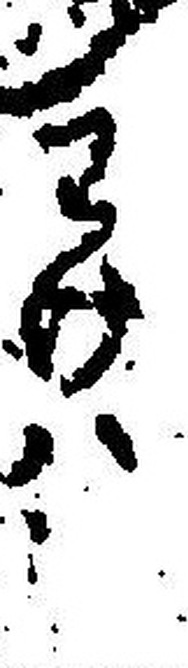わけは
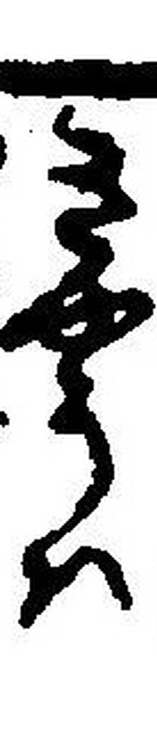きやうは
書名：間違狐之女郎買 / 市場通笑作
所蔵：東京大学総合図書館 General Library in the University of Tokyo, JAPAN
